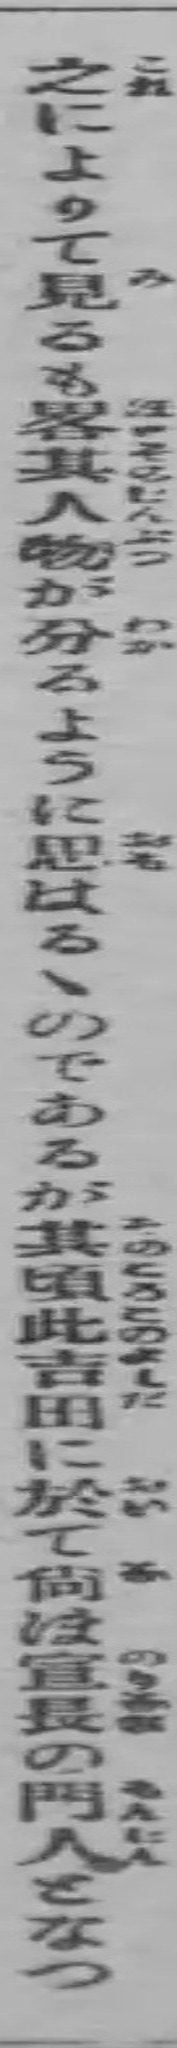之によりて見るも略其人物が分るように思はるゝのであるが其頃此吉田に於て尚ほ宣長の門人となつ
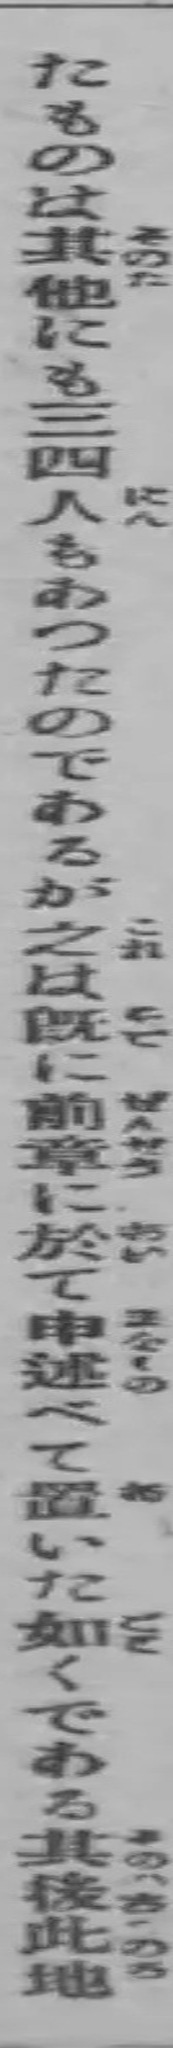たものは其他にも三四人もあつたのであるが之は既に前章に於て申述べて置いた如くである其後此地
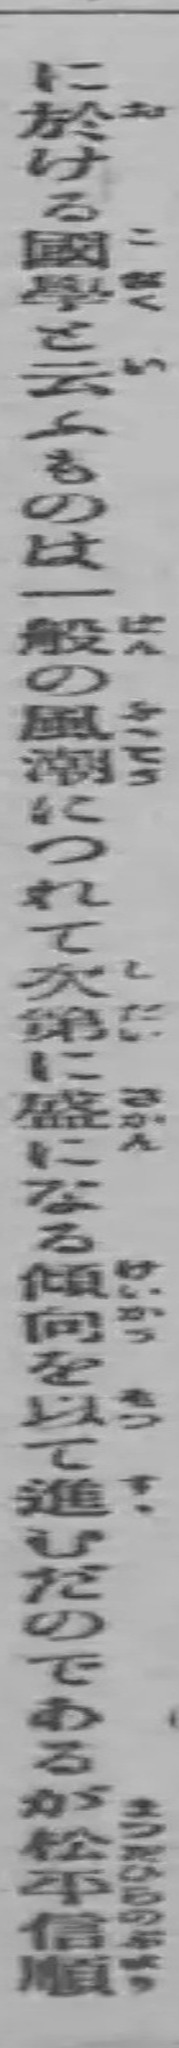に於ける国学と云ふものは一般に風潮につれて次第に盛になる傾向を以て進むだのであるが松平信順
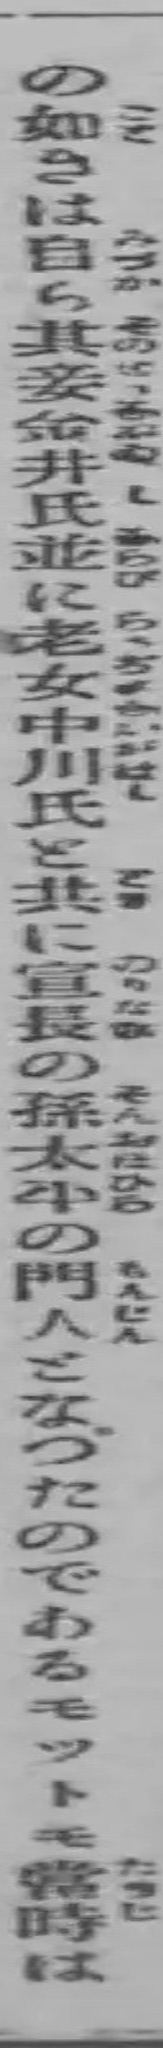の如きは自ら其妾金井氏並に老女中川氏と共に宣長の孫大平の門人となつたのであるモツトモ当時は
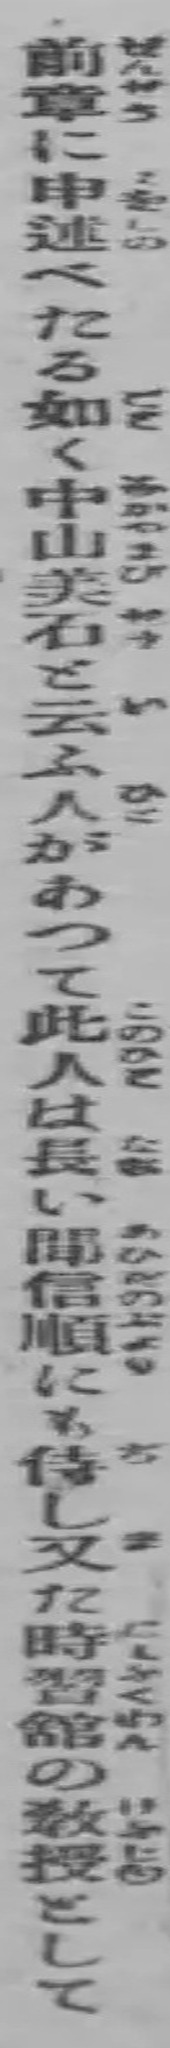前章に申述べたる如く中山美石と云ふ人があつて此人は長い間信順にも侍し又た時習館の教授として
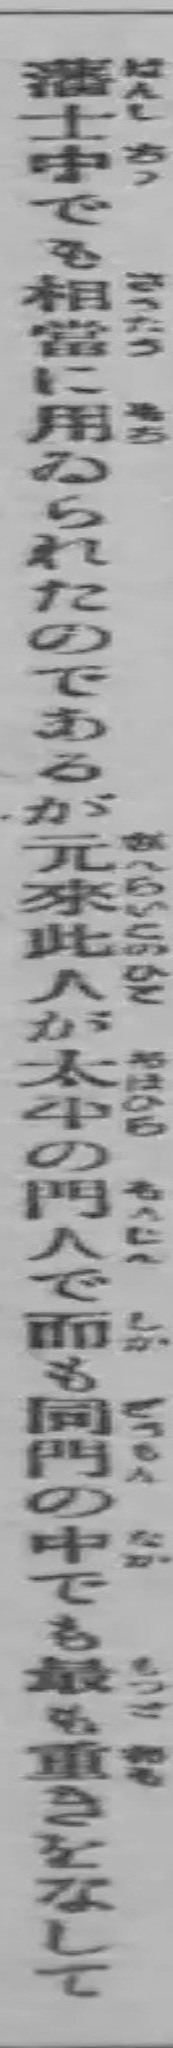藩士中でも相当に用ゐられたのであるが元来此人が大平の門人で而も同門の中でも最も重きをなして
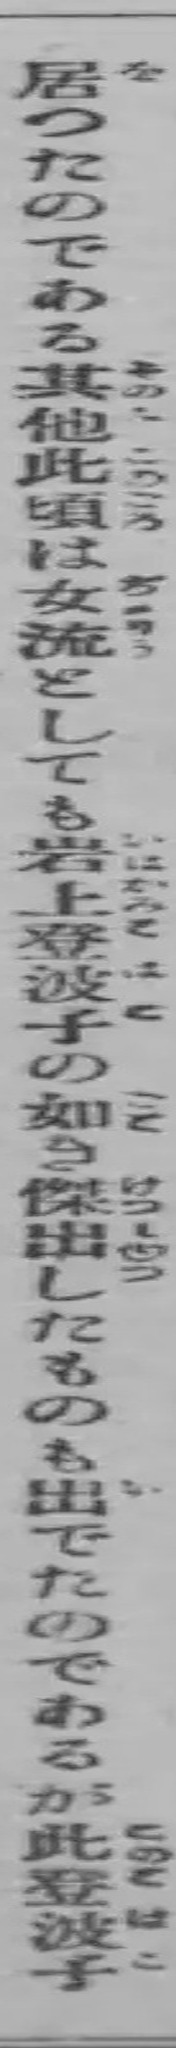岩上登波子居つたのである其他此頃は女流としても岩上登波子の如き傑出したもの出でたのであるが此登波子
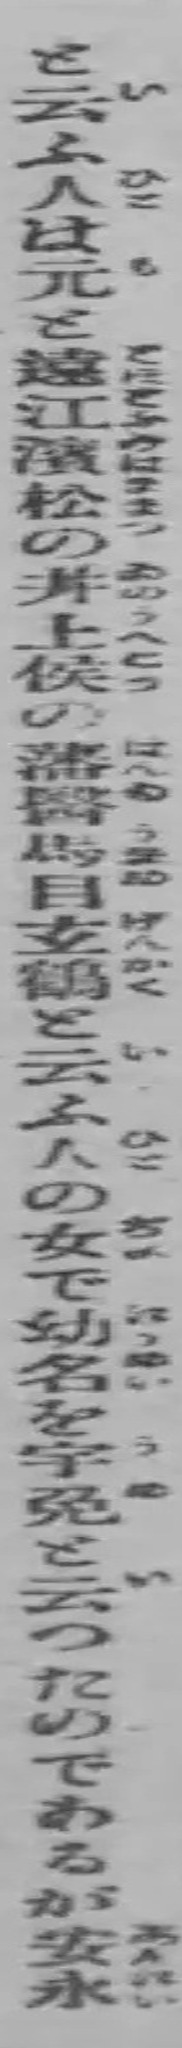と云ふ人は元と遠江浜松の井上侯の藩医馬目玄鶴と云ふ人の女で幼名を宇免と云つたのであるが安永
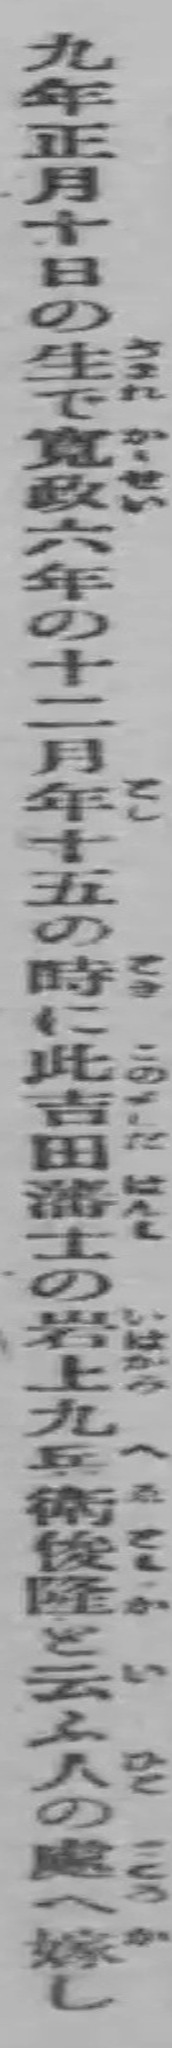九年正月十日の生で寛政六年の十二月年十五の時に此吉田藩士の岩上九兵衛俊隆と云ふ人の処へ嫁し
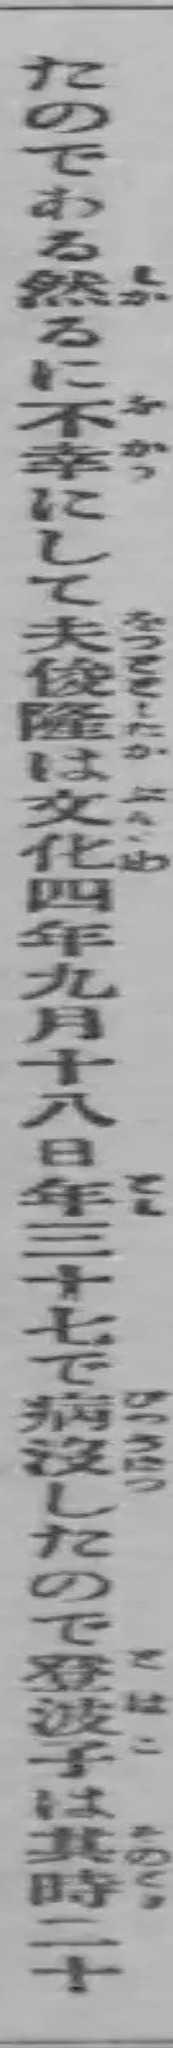たのである然るに不幸にして夫俊隆は文化四年九月十八日年三十七で病没したので登波子は其時二十
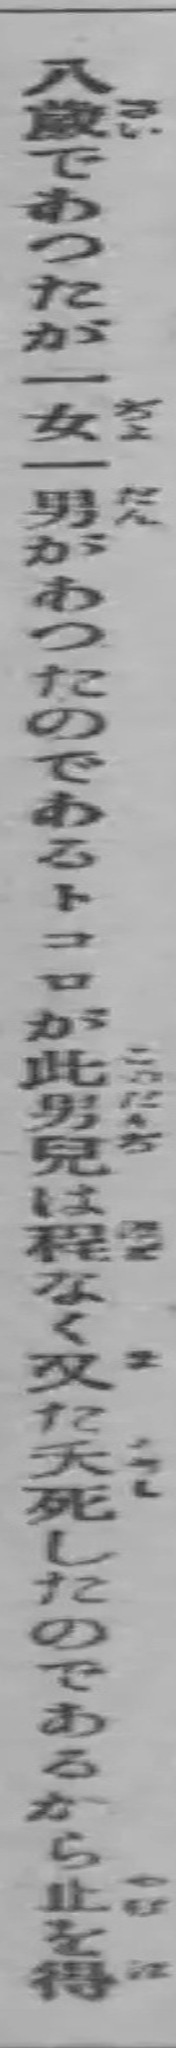八歳であつたが一女一男があつたのであるトコロが此男児は程なく夭死したのであるから止を得

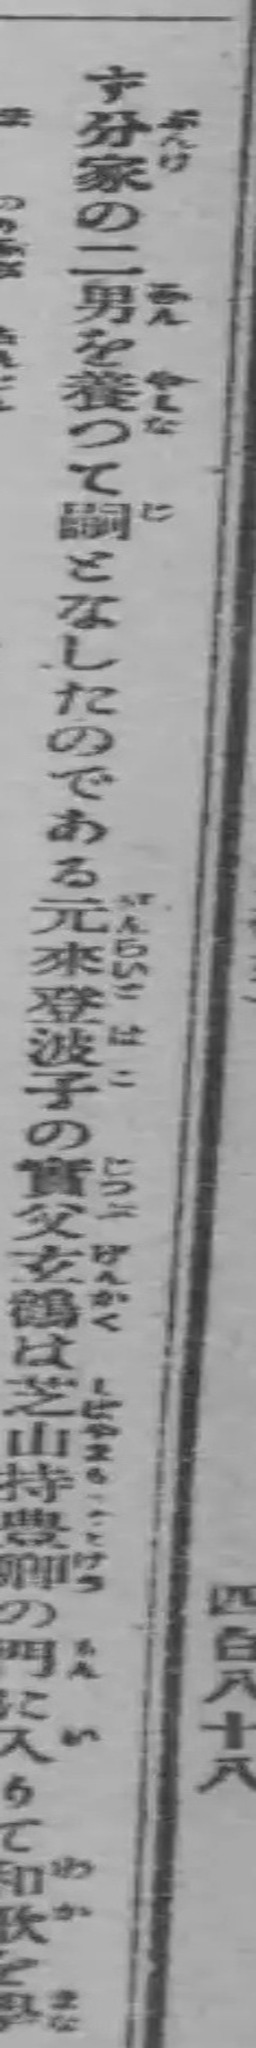ず分家の二男を養つて嗣となしたのである元来登波子の実父玄鶴は芝山持豊卿の門に入りて和歌を学
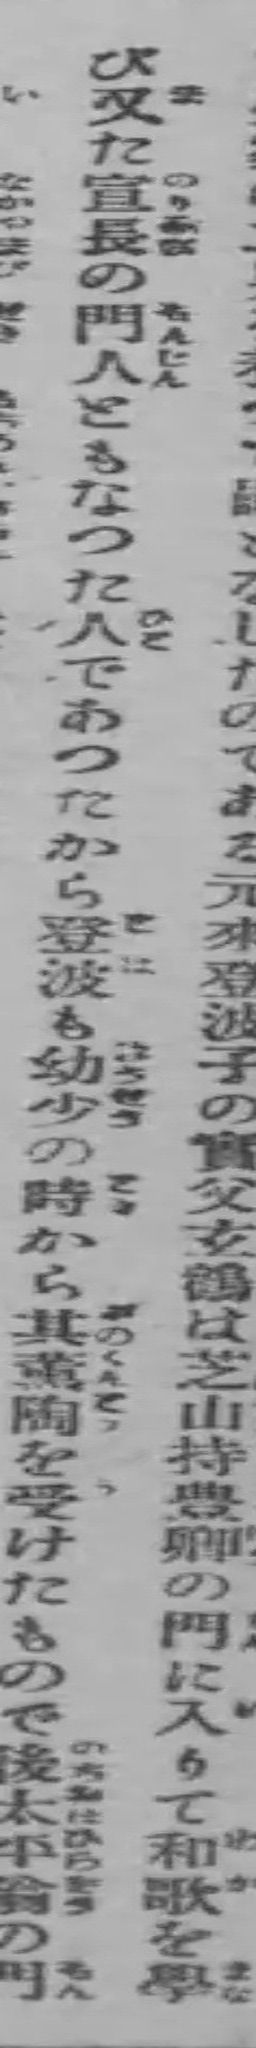び又た宣長の門人ともなつた人であつたから登波も幼少の時から其薫陶を受けたもので後大平翁の門
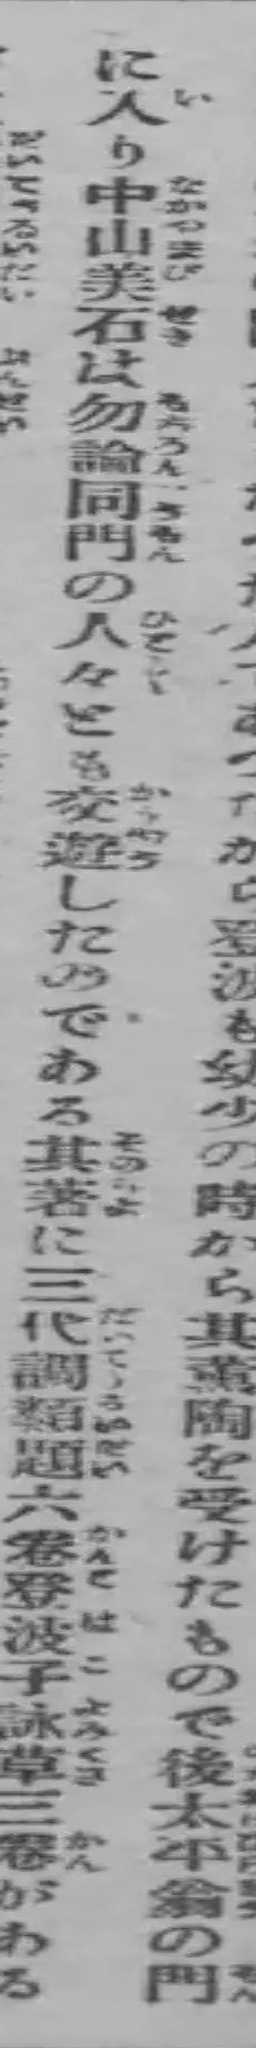に入り中山美石は勿論同門の人々とも交遊したのである其著に三代調類題六巻登波子詠草三巻がある
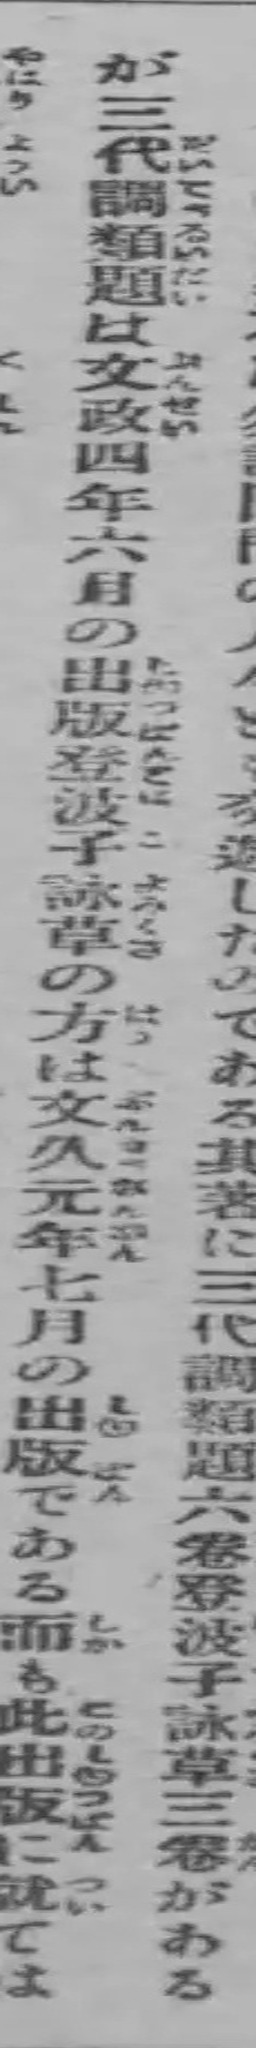が三代調類題は文政四年六月の出版登波子詠草の方は文久元年七月の出版である而も此出版に就ては
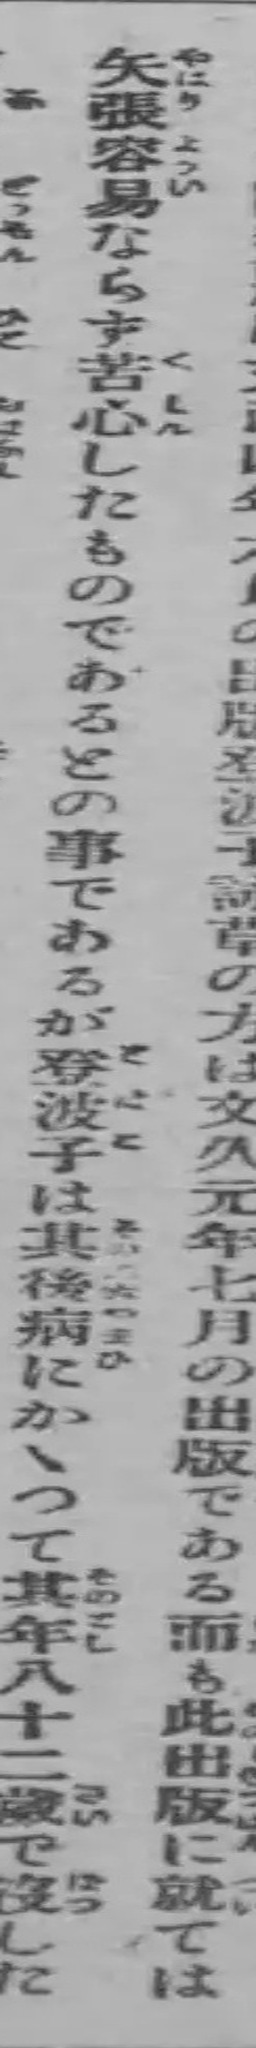矢張容易ならず苦心したものであるとの事であるが登波子は其後病にかゝつて其年八十二歳で没した
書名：豊橋市史談
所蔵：国立国会図書館 National Diet Library, JAPAN
